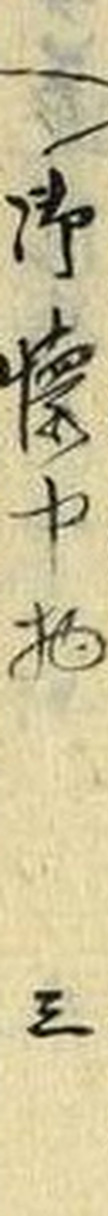御懐中物三
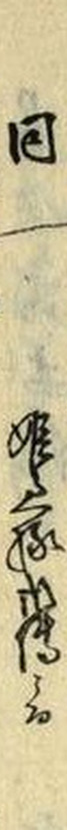同姫君様御伝ニ而
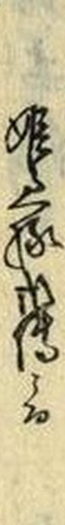同姫君様御伝ニ而
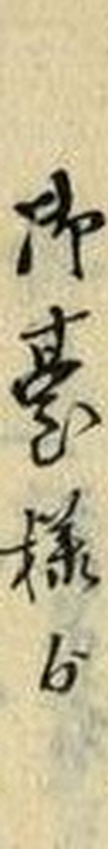御台様ゟ
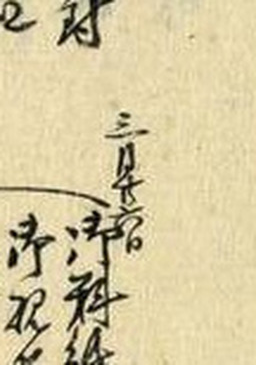三月廿二日
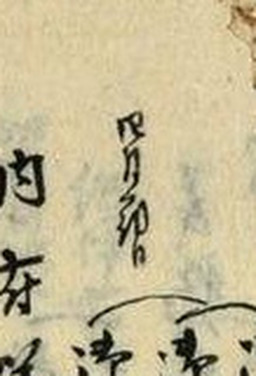四月三日
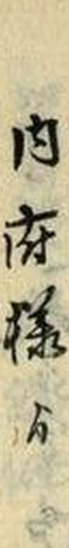内府様ゟ
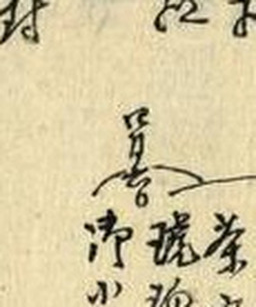四月六日
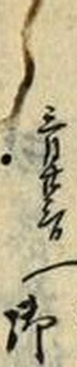三月廿三日
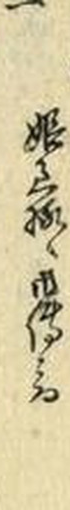同姫君様御伝ニ而
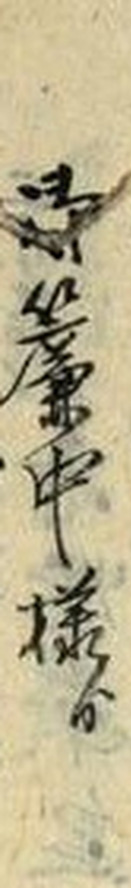御簾中様ゟ

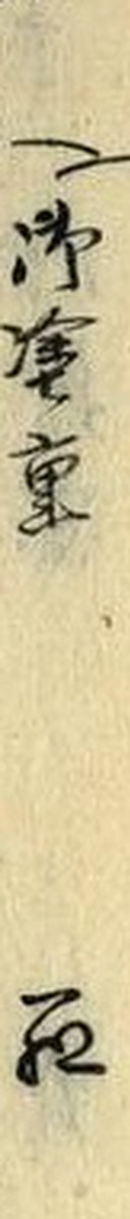御塗重一組
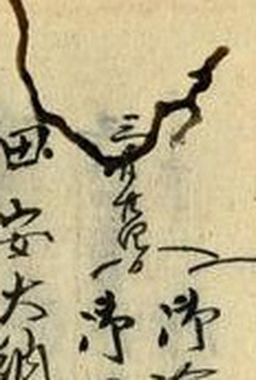三月廿四日
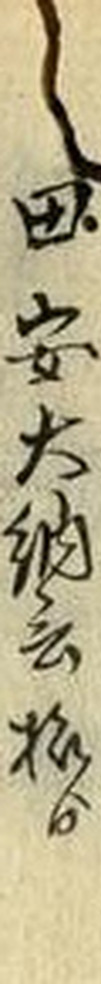田安大納言様ゟ
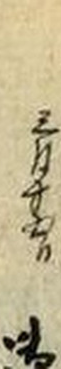三月廿五日
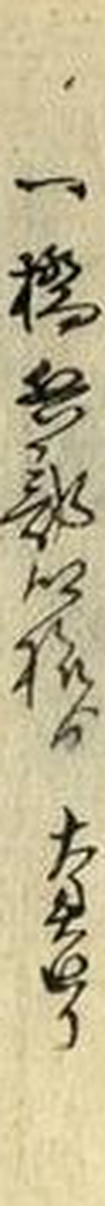一橋兵部卿様ゟ大奥廻り
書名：少傅日録抄（斉承付側向頭取日記、在府）
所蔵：福井県文書館 Fukui Prefectural Archives
